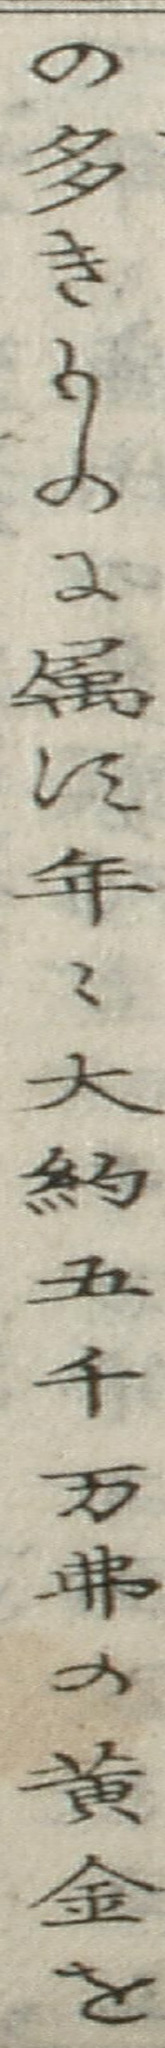の多きものに属す、年々大約五千万弗の黄金を
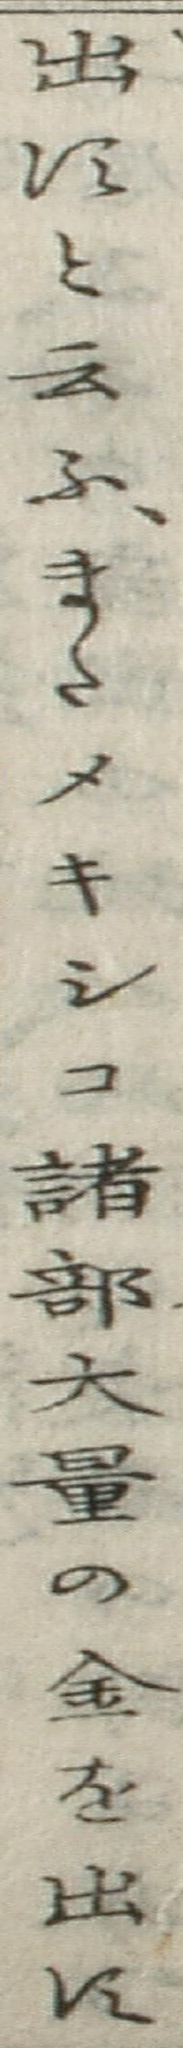出すと云ふ、またメキシコ諸部大量の金を出す、
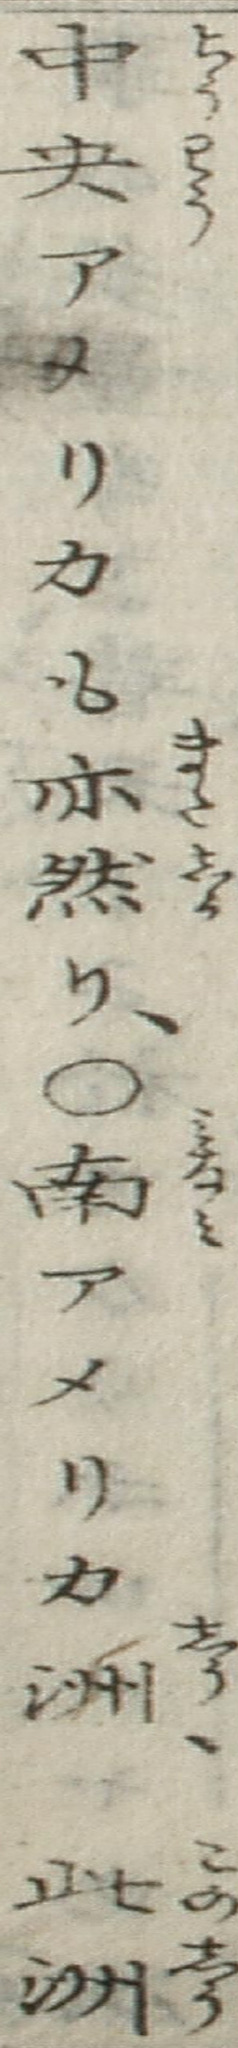中央アメリカも亦然り、○南アメリカ洲、此洲
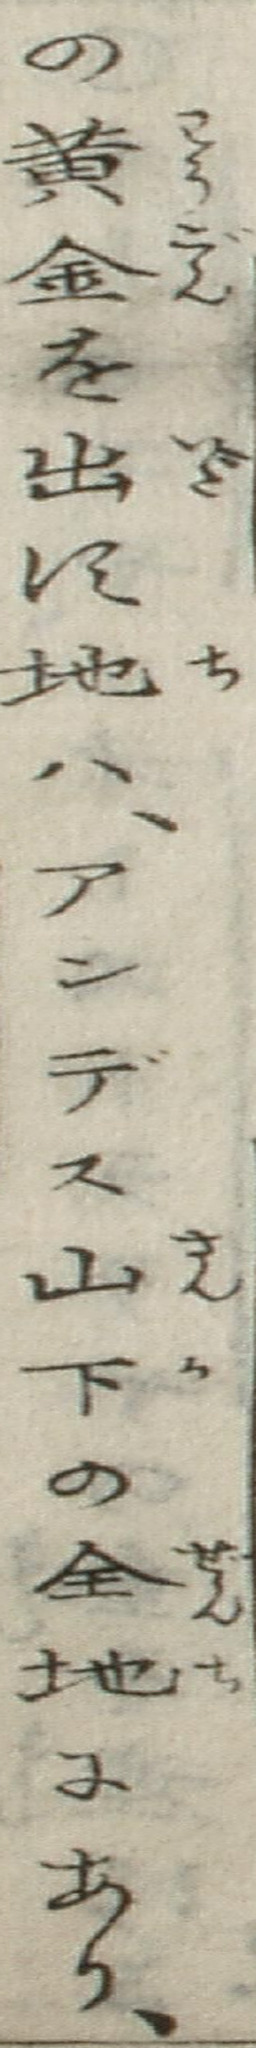の黄金を出す地は、アンデス山下の全地にあり、

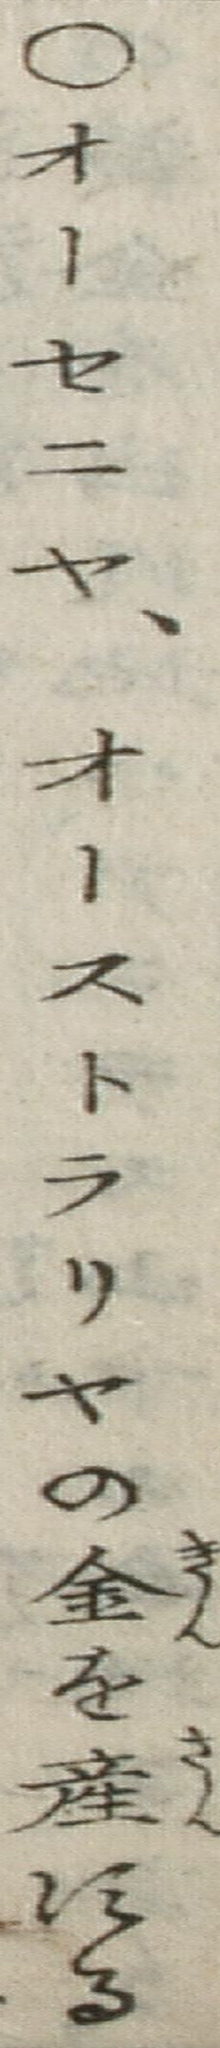○オーセニヤ、オーストラリヤの金を産する
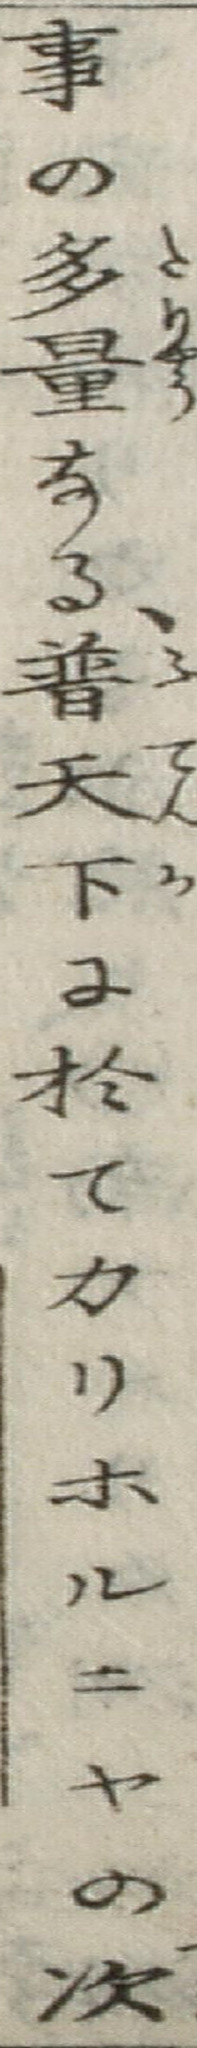事の多量なる、普天下に於てカリホルニヤの次
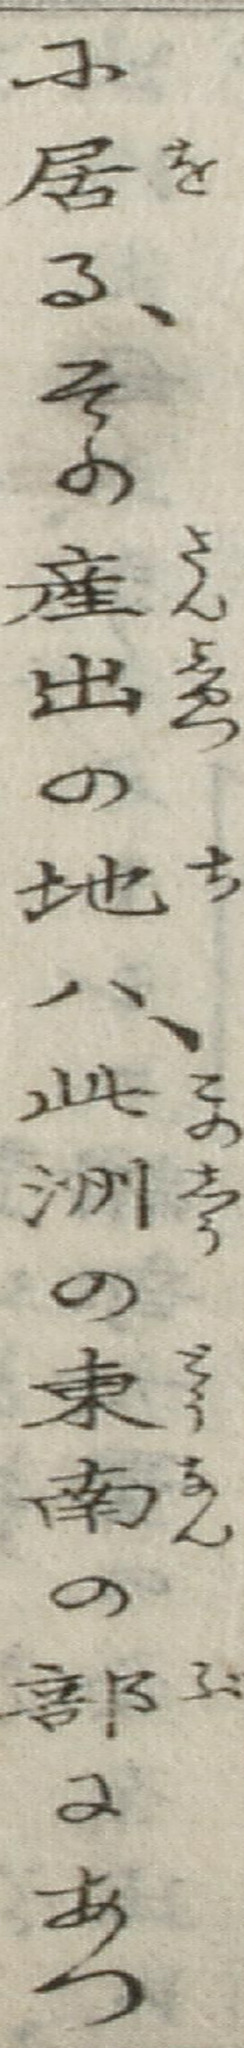に居る、その産出の地は、此洲の東南の部にあつ
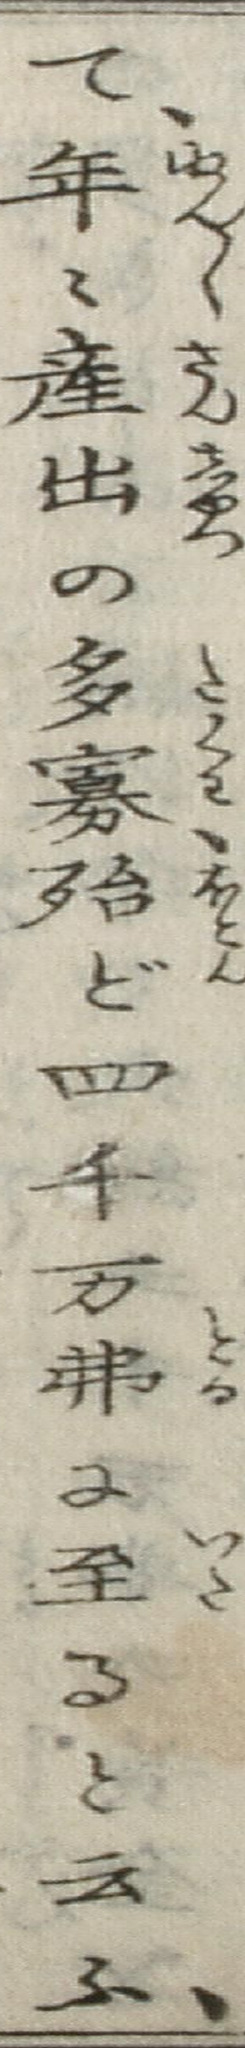て、年々産出の多寡、殆ど四千万弗に至ると云ふ、
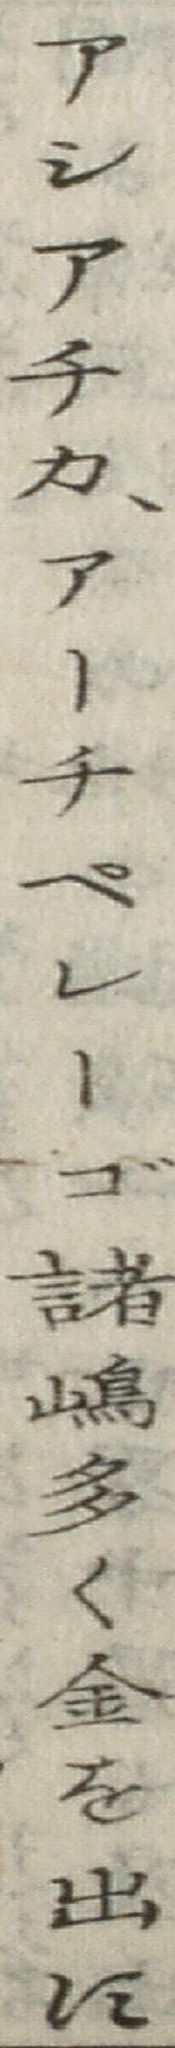アシアチカ、アーチペレーゴ諸島多く金を出す、
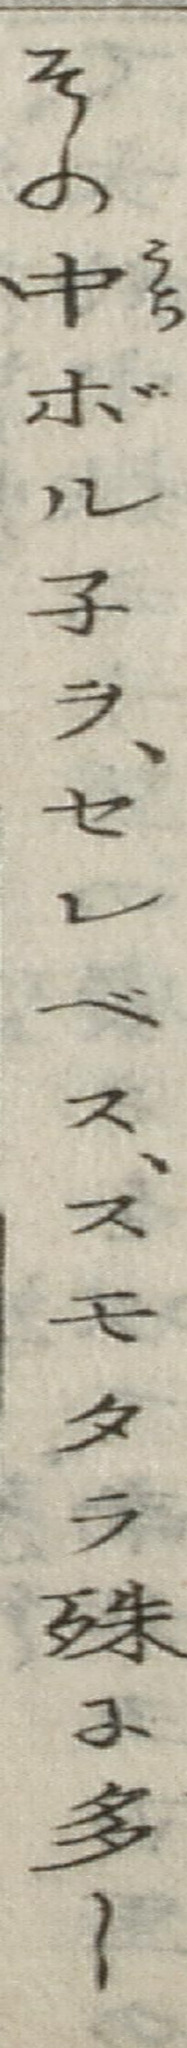その中ボルネヲ、セレベス、スモタラ殊に多し
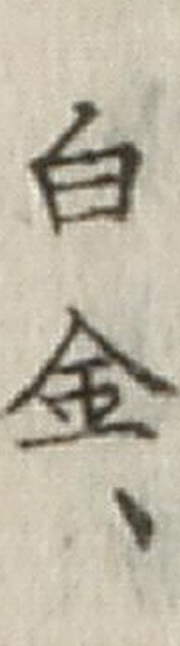白金、
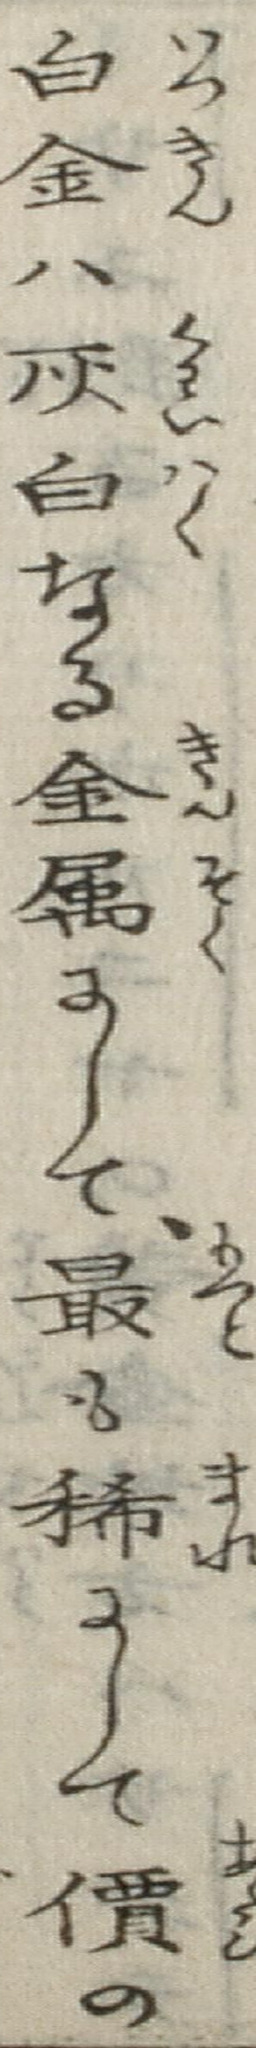白金は灰白なる金属にして、最も稀にして価の
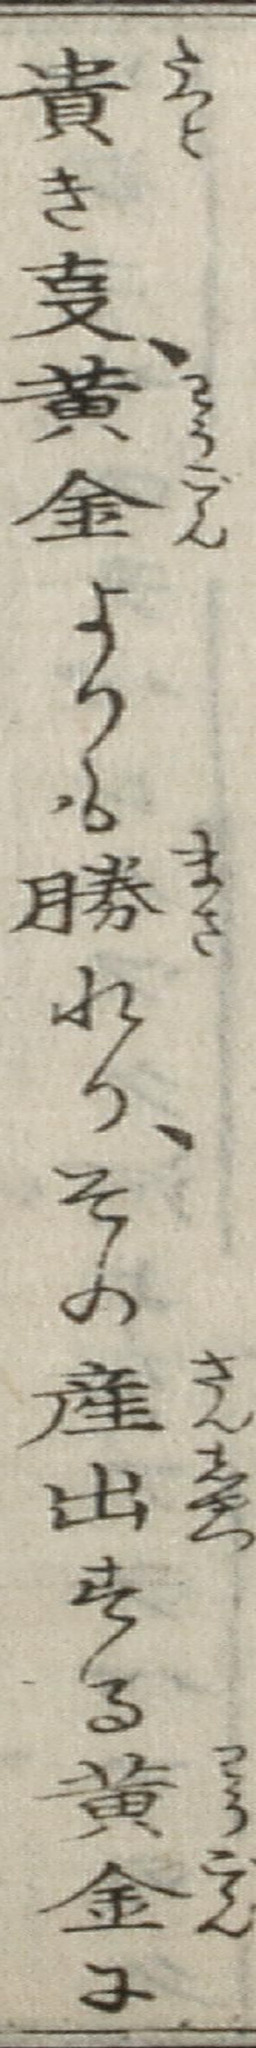貴き事、黄金よりも勝れり、その産出する黄金に
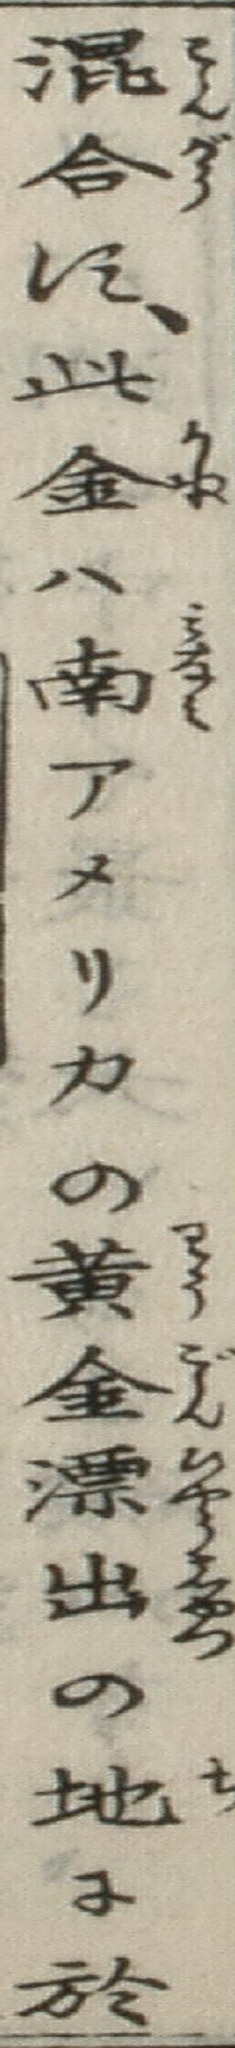混合す、此金は南アメリカの黄金漂出の地に於
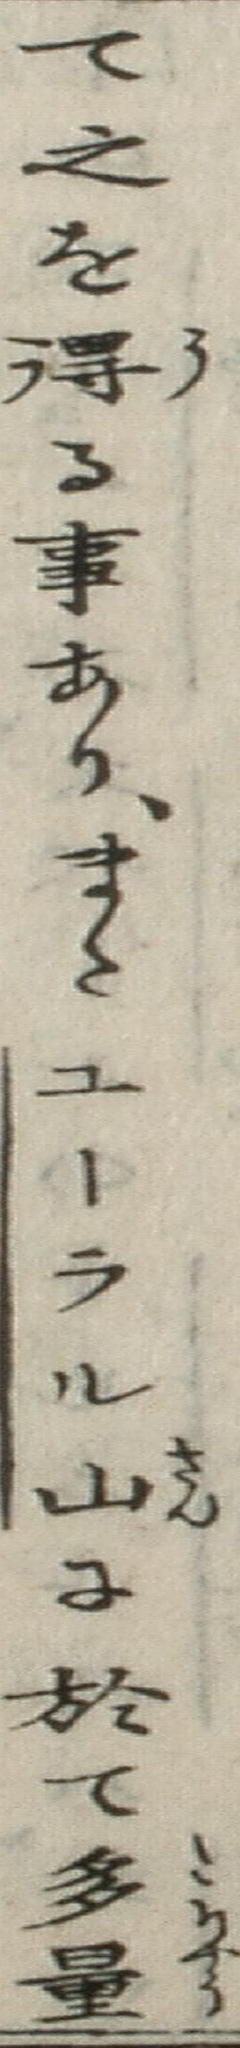て之を得る事あり、またユーラル山に於て多量
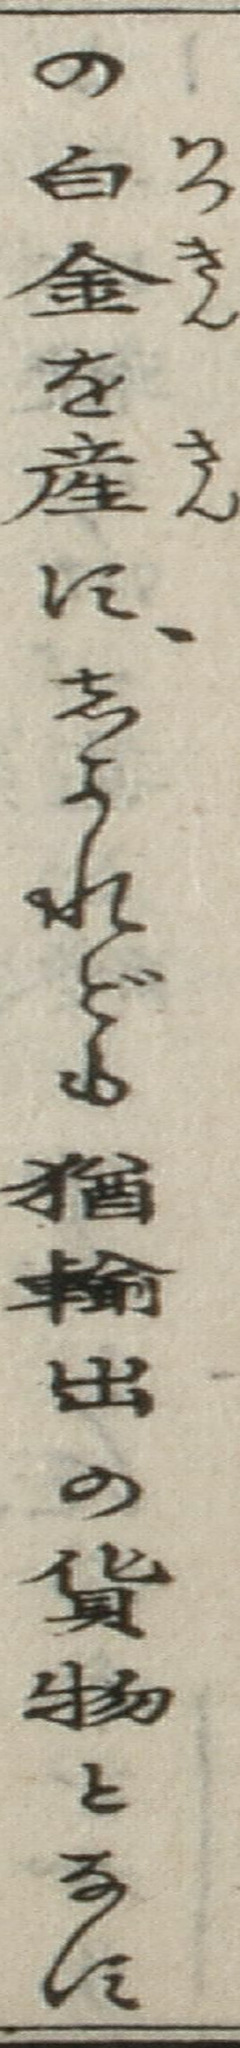の白金を産す、しかれども猶輸出の貨物となす
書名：訓蒙　天然地理學　下
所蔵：東京大学地震研究所図書室 Earthquake Research Institute Library, The University of Tokyo, JAPAN
